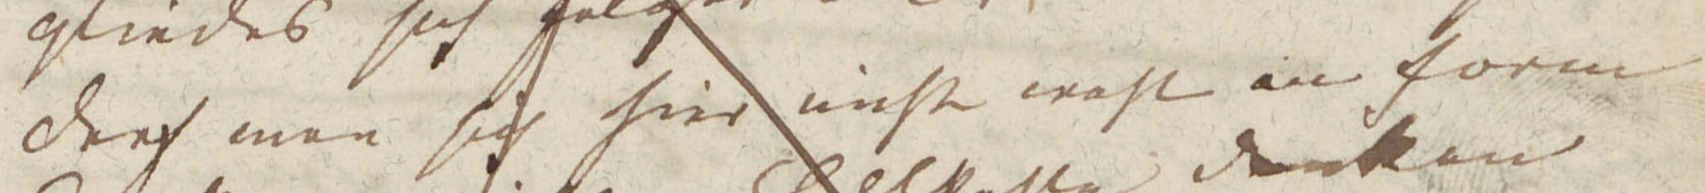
darf man sich hier nicht wohl in Form
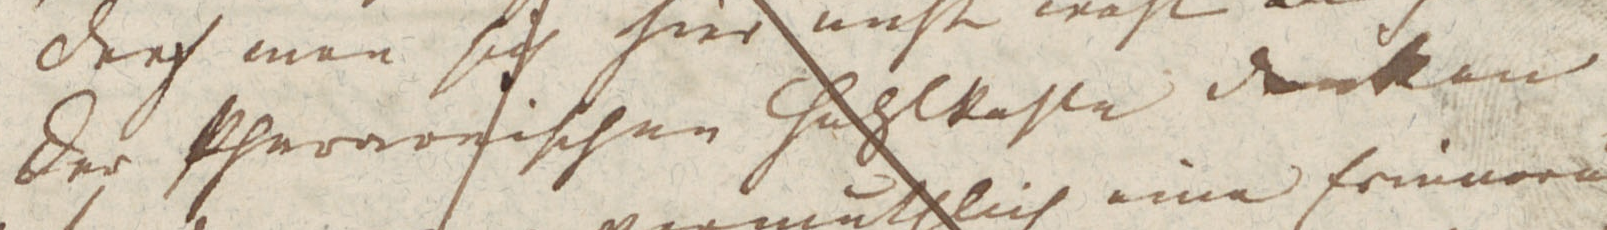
der Pharaonischen Hohlkehle denken
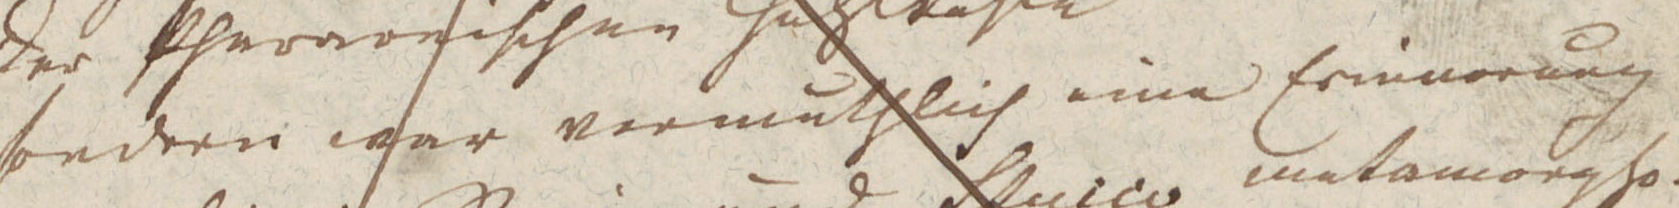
sondern war vermuthlich eine Erinnerung
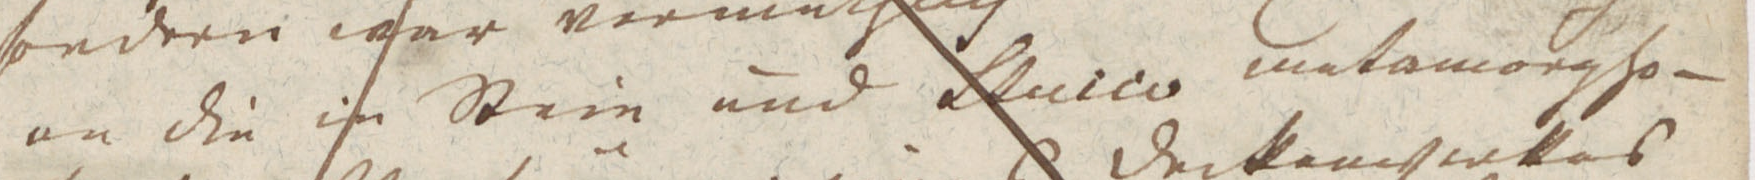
an die in Stein und Stucco metamorpho-
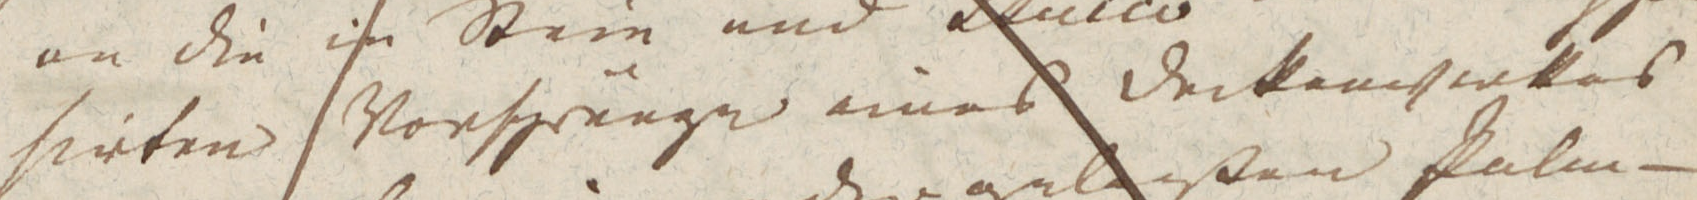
sirten Vorsprünge eines Deckenwerkes
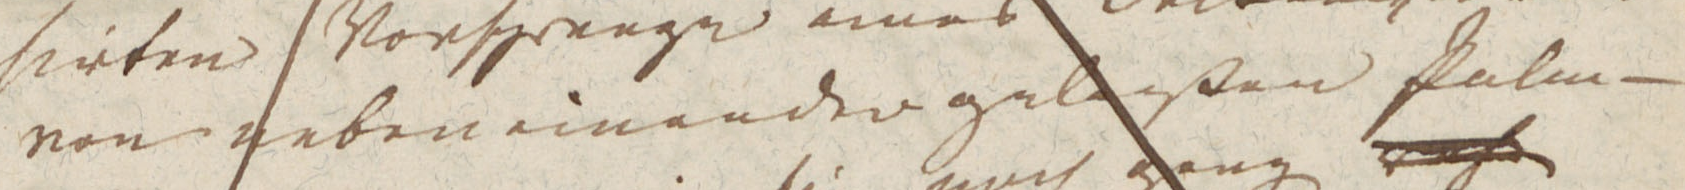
von neben einander gelegten Palm-
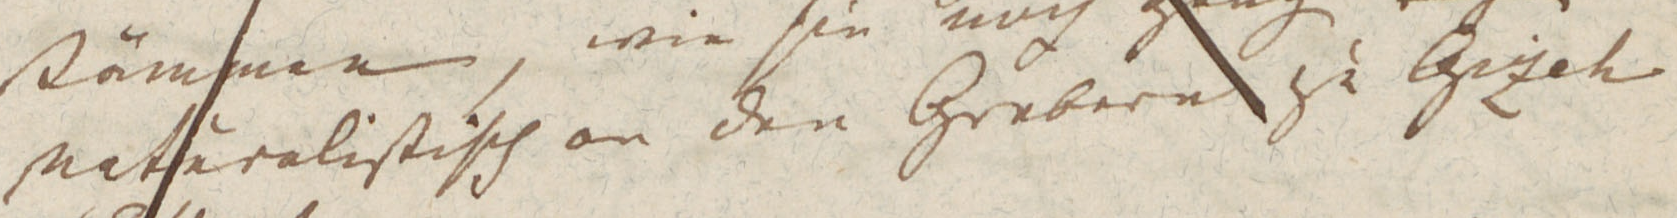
naturalistisch an den Gräbern zu Gizeh
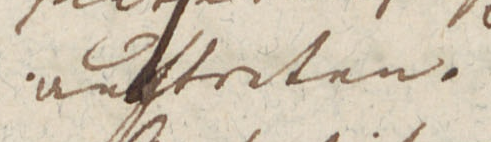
auftreten. –
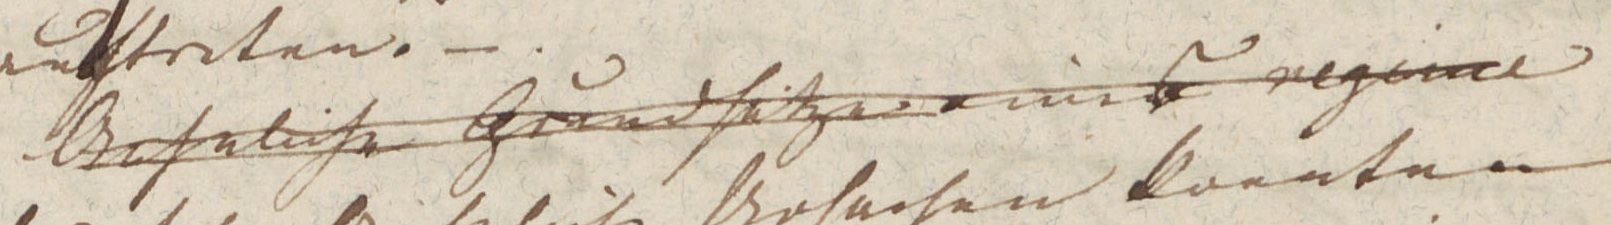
Aehnliche Grundsätze einers regime
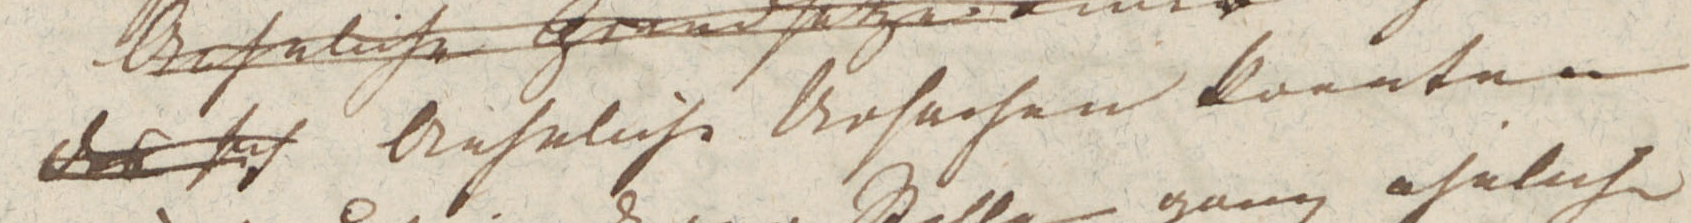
das sich Aehnliche Ursachen konnten
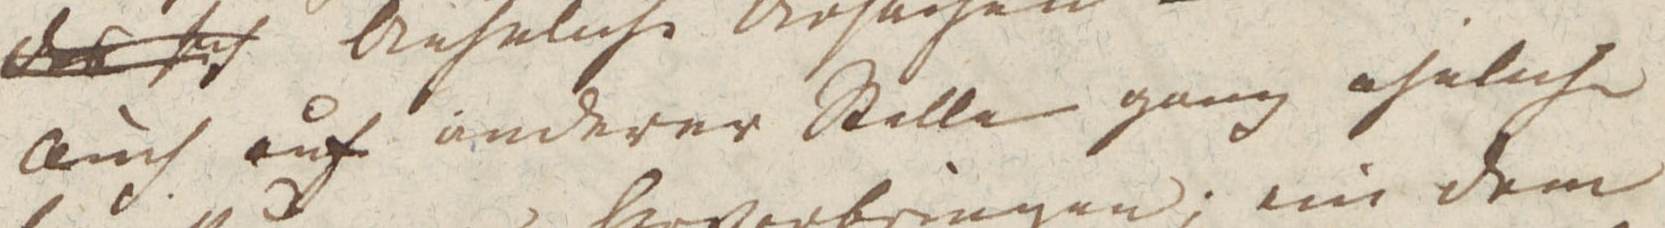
auch auf anderer Stelle ganz ähnliche
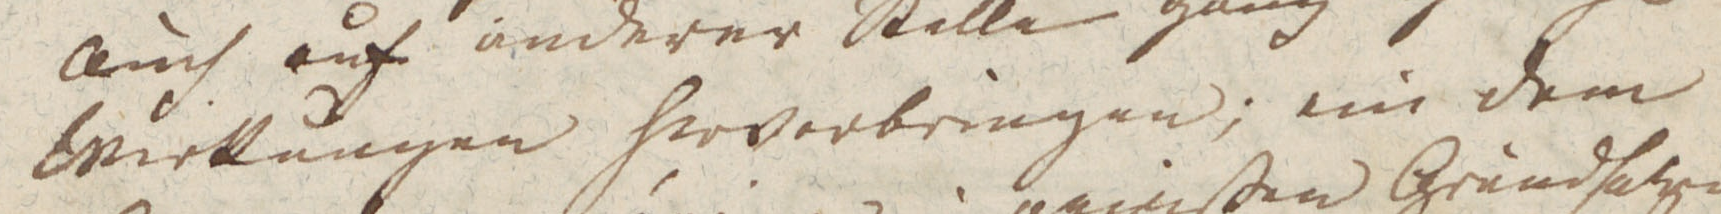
Wirkungen hervorbringen; ein dem
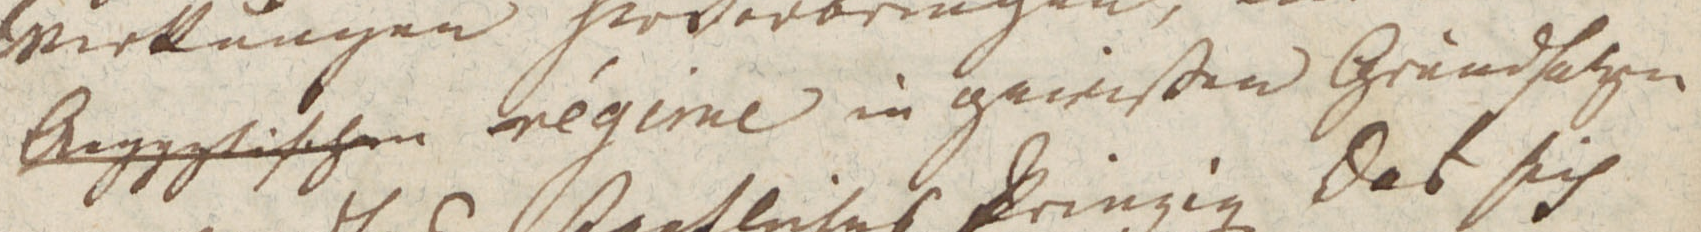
Aegyptischen régime in gewissen Grundsatzen
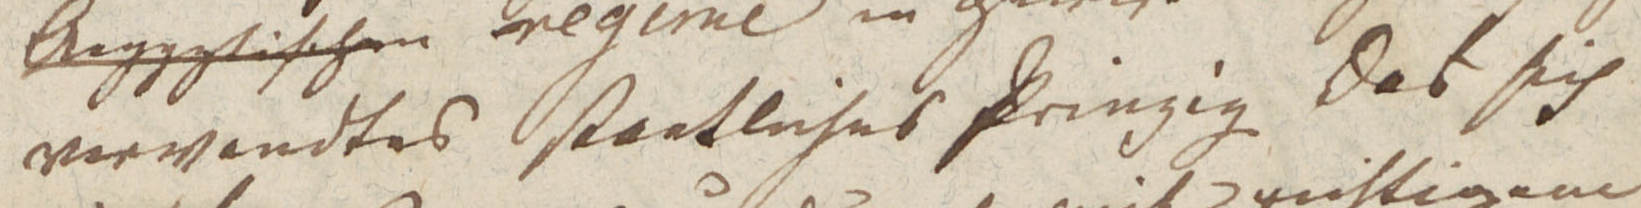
verwandtes staatliches Prinzip das sich
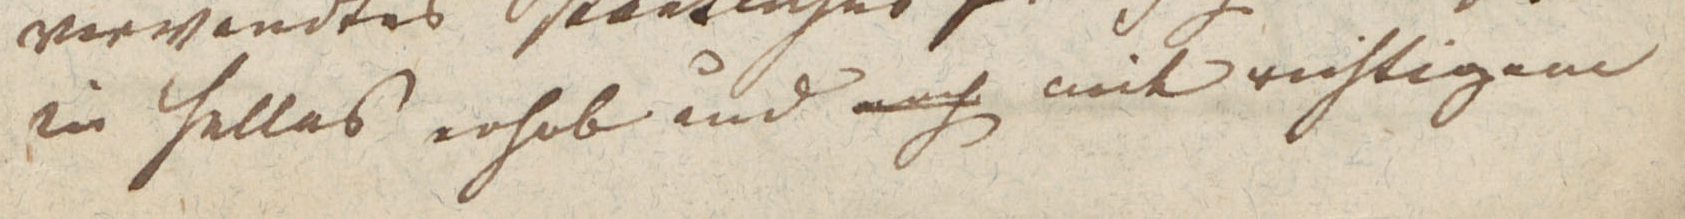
in Hellas erhob und noch mit richtigem
